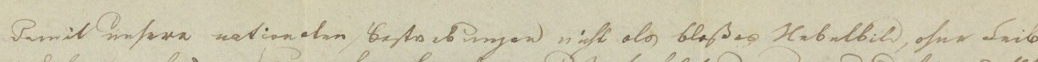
damit unsere nationalen Bestrebungen nicht als bloßes Nebelbild, ohne Leib
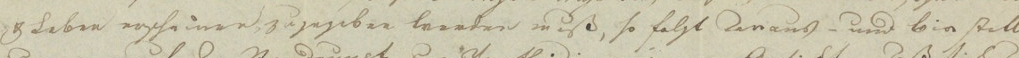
& Leben erscheinen, zugegeben werden muß, so folgt daraus – und wir stellten
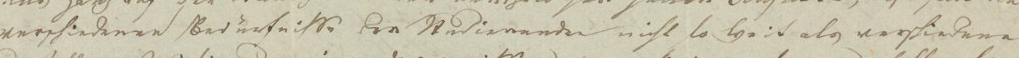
verschiedenen Bedürfnisse der Studierenden nicht so weit als verschiedene
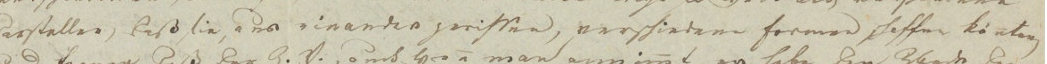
darstellen, daß sie, auseinander gerissen, verschiedene Formen schaffen könnten,
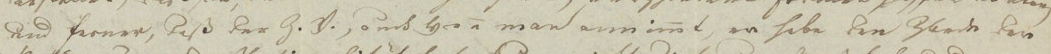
und ferner, daß der Z.V., auch wenn man annimmt, er haben den Zweck der
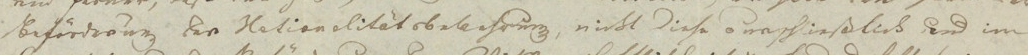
Beförderung der Nationalitätsbewahrung, nicht diese ausschließlich und im
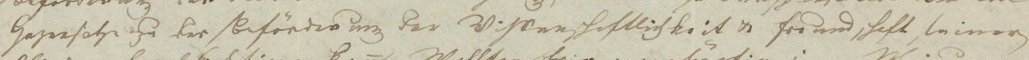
Gegensatz zu der Beförderung der Wissenschaftlichkeit & Freundschaft seiner
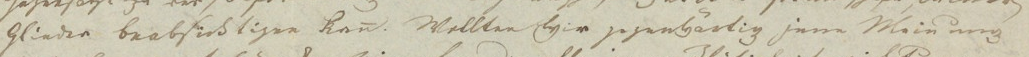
Glieder beabsichtigen kann. Wollten wir gegenwärtig jene Meinung
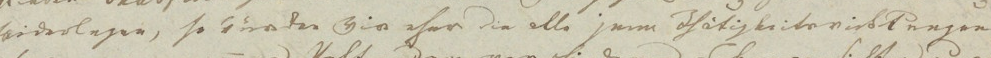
widerlegen, so würden wir eher die alle jene Thätigkeitsrichtungen
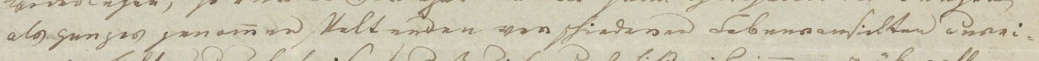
als ganzes genommen spaltenden verschiedenen Lebensansichten ausei-
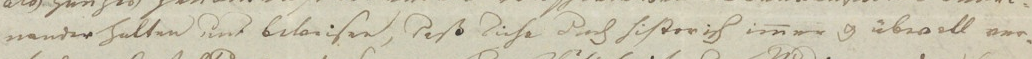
nander halten und beweisen, daß diese auch historisch immer & überall ver-
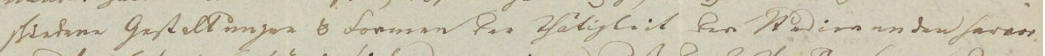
schiedene Gestaltungen & Formen der Thätigkeit der Studierenden hervor-
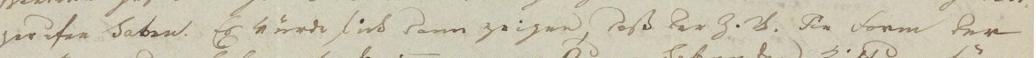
gerufen haben. Es würde sich dann zeigen, daß der Z.V. die Form der
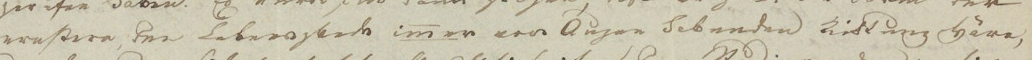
ernstern, den Lebenszweck immer vor Augen habenden Richtung wäre,
